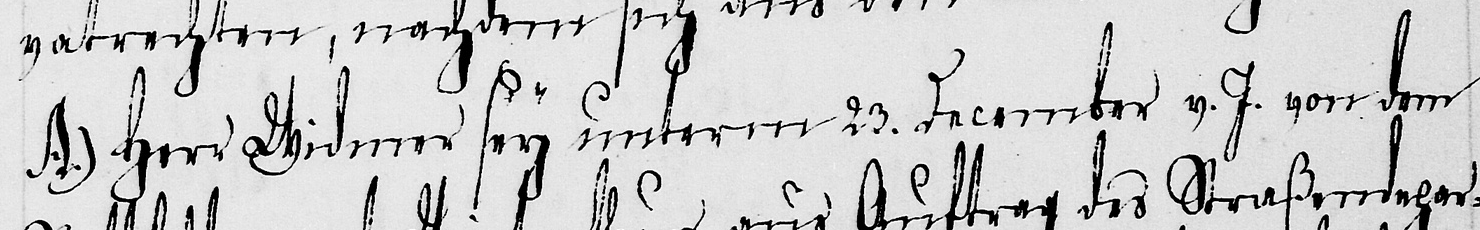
A.) Herr Widmer sey unterm 23. December v. J. von dem
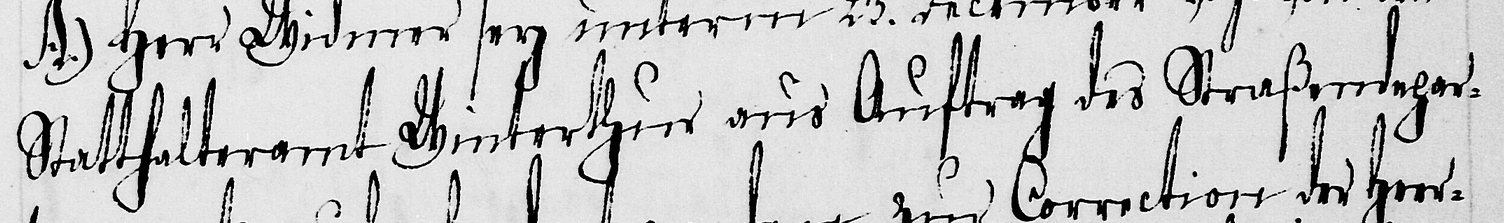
Statthalteramt Winterthur aus Auftrag des Straßendepar¬
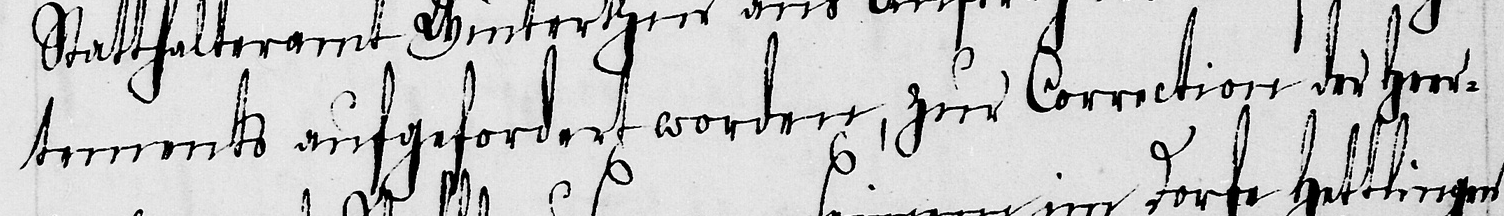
tements aufgefordert worden, zur Correction der Heer¬
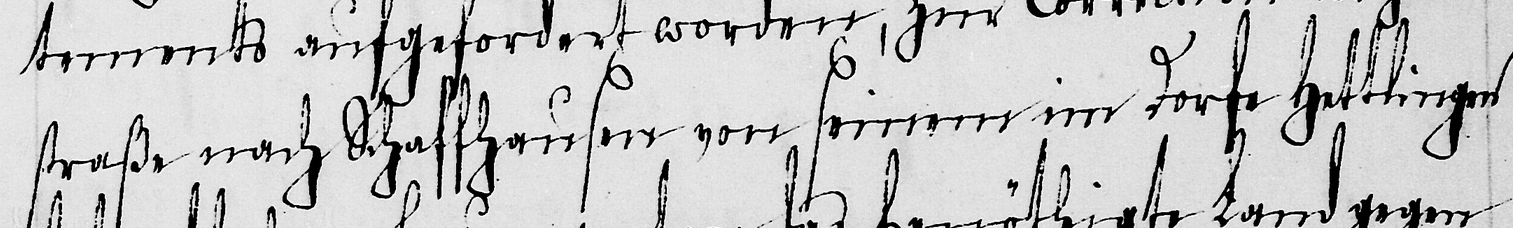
straße nach Schaffhausen von seinem im Dorfe Hettlingen
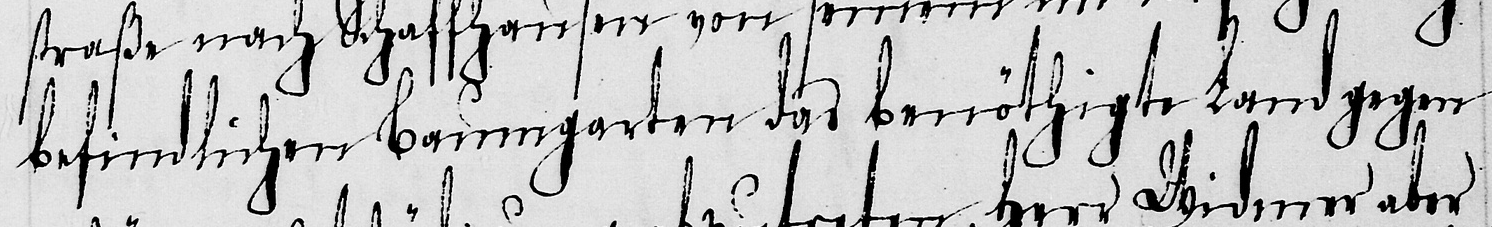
befindlichen Baumgarten das benöthigte Land gegen
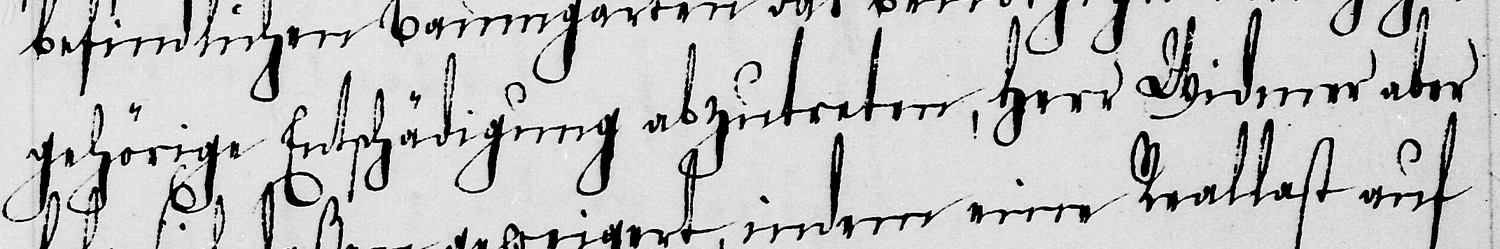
gehörige Entschädigung abzutreten, Herr Widmer aber
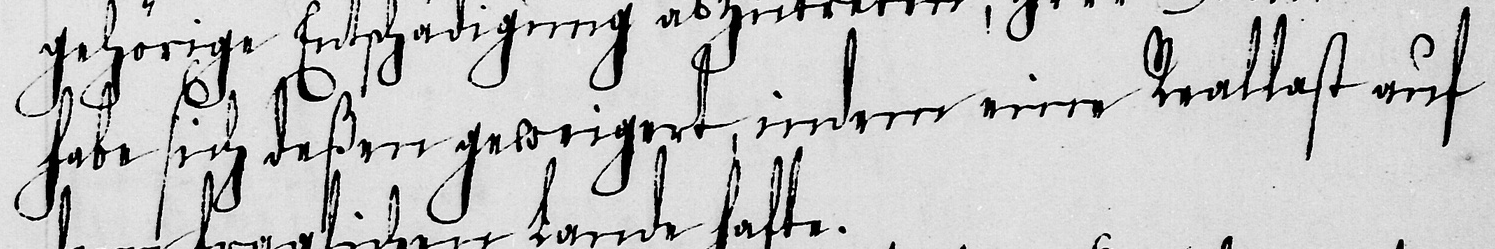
habe sich deßen geweigert, indem eine Reallast auf
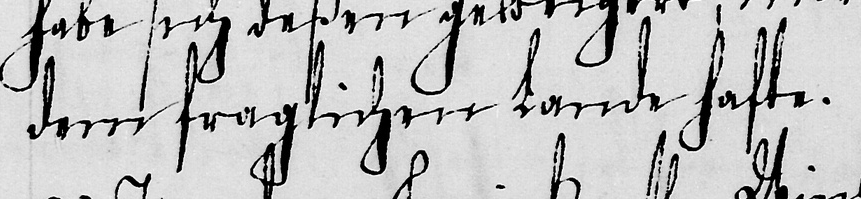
dem fraglichen Lande hafte.
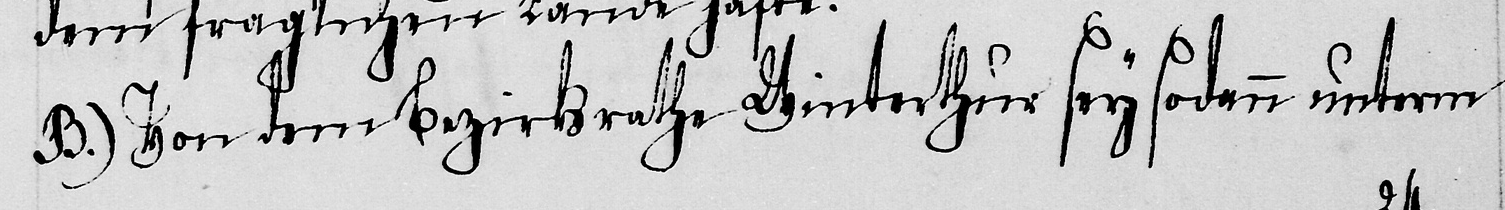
B.) Von dem Bezirksrathe Winterhtur sey sodann unterm
